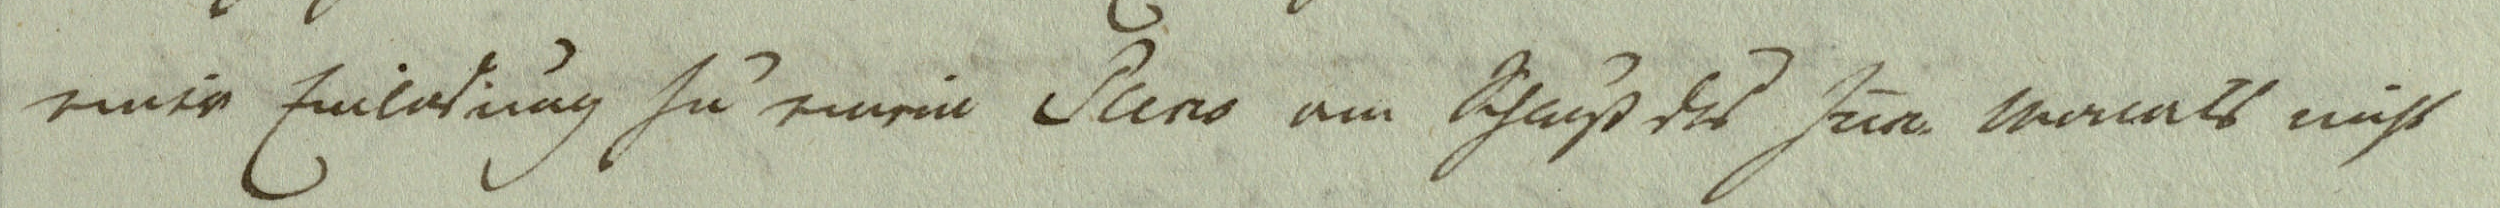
einer Einladung zu einem Pleno am Schluß des Jun Monats nicht
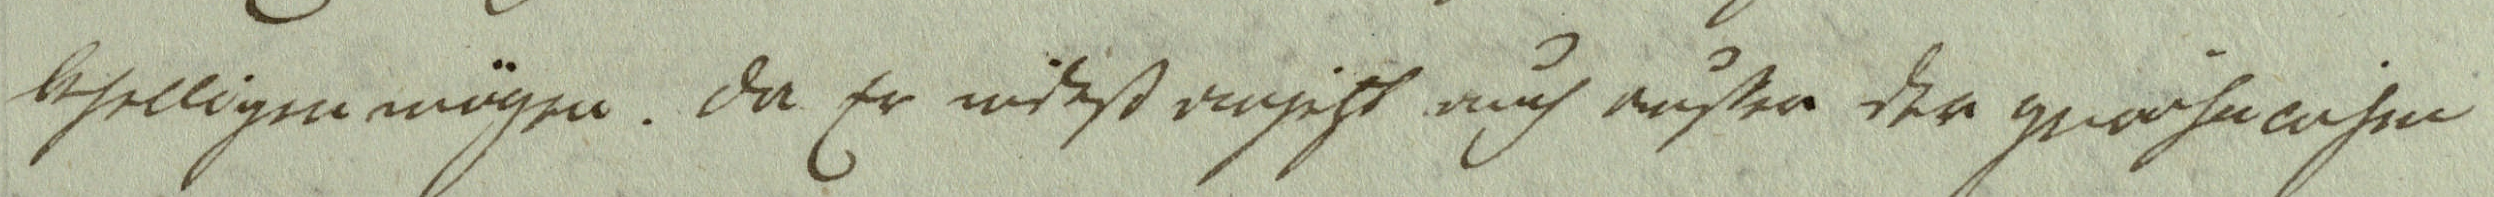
behelligen mögen. Da Er indeß anjetzt auch außer der gewöhnlichen
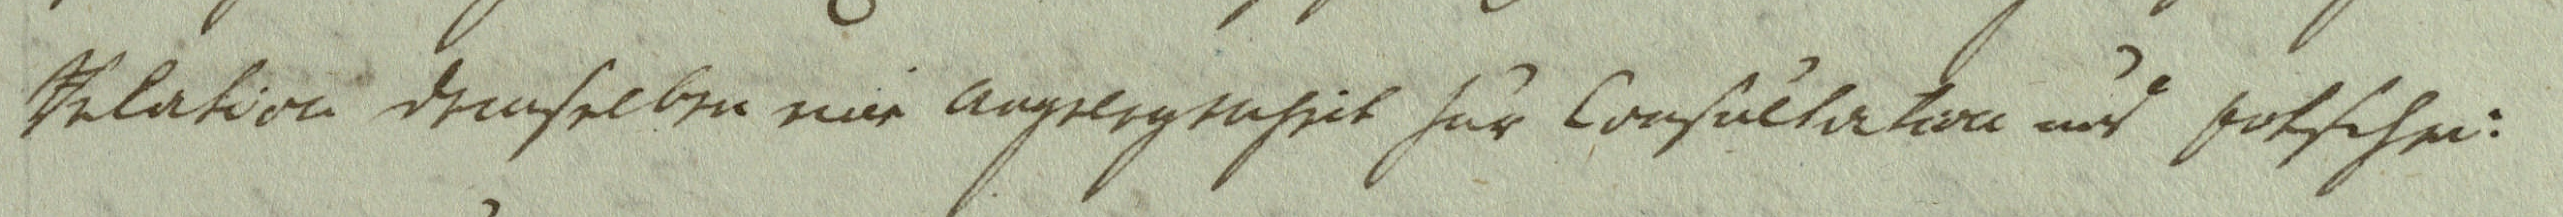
Relation demselben eine Angelegenheit zur Consultation und Entschei¬
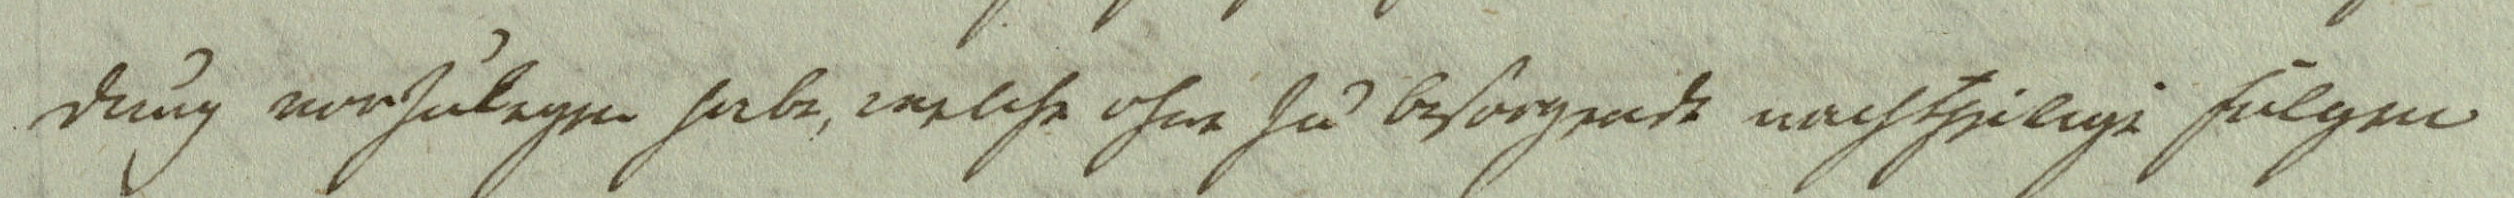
dung vorzulegen habe, welche ohne zu besorgende nachtheilige Folgen
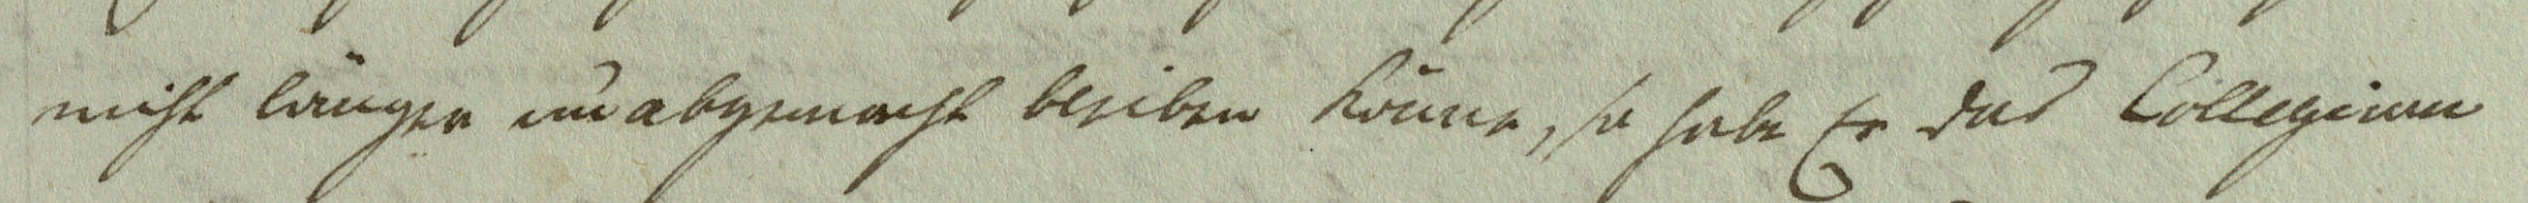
nicht länger unabgemacht bleiben könne, so habe Er das Collegium
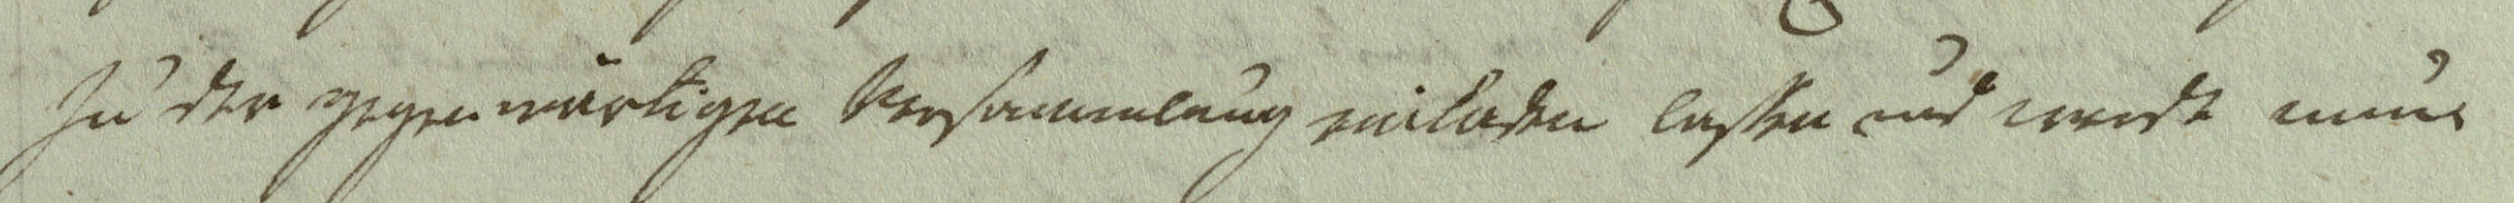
zu der gegenwärtigen Versammlung einladen lassen und werde nun¬
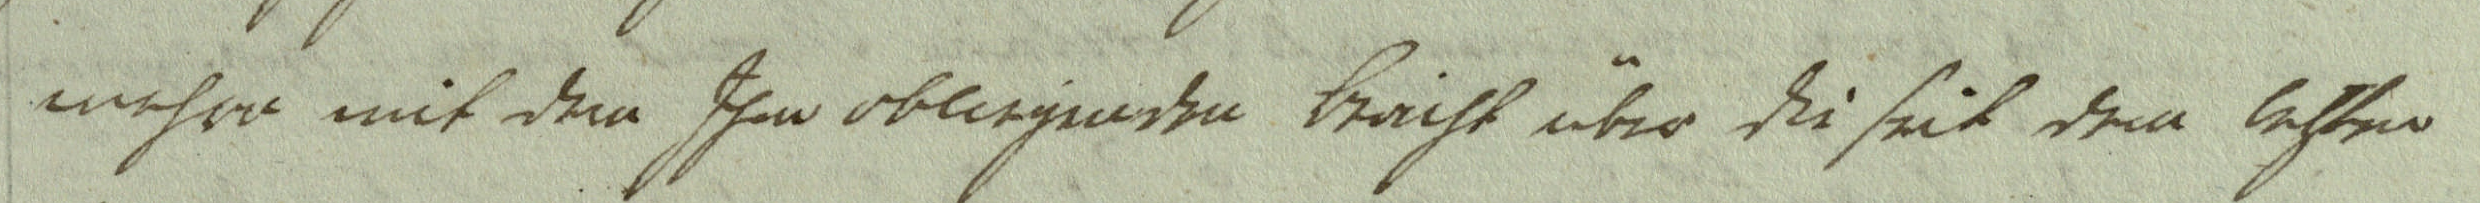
mehro mit dem Ihm obliegenden Bericht über die seit dem letzten
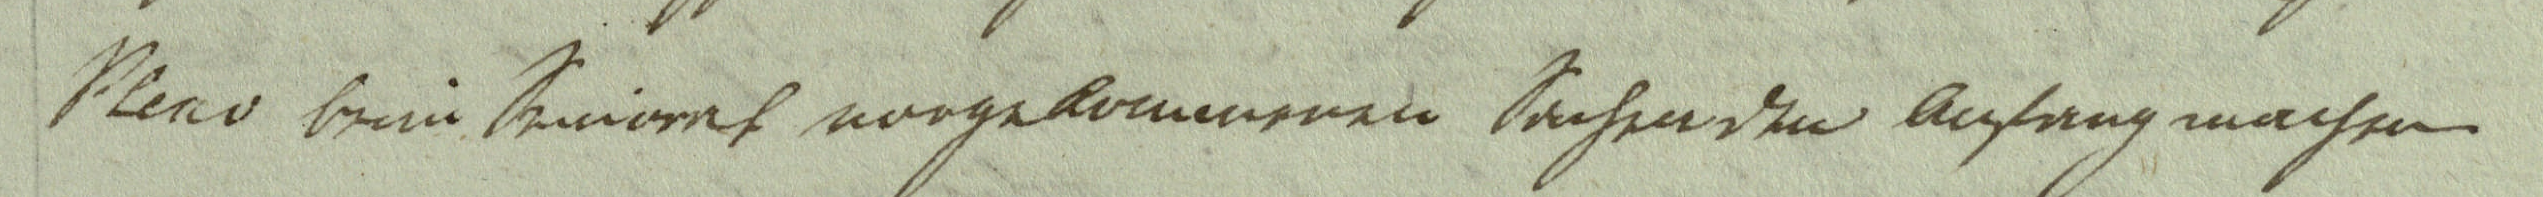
Pleno beim Seniorat vorgekommenen Sachen den Anfang machen.
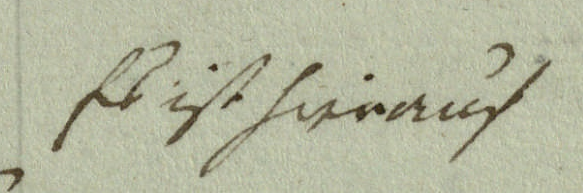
Es ist hierauf
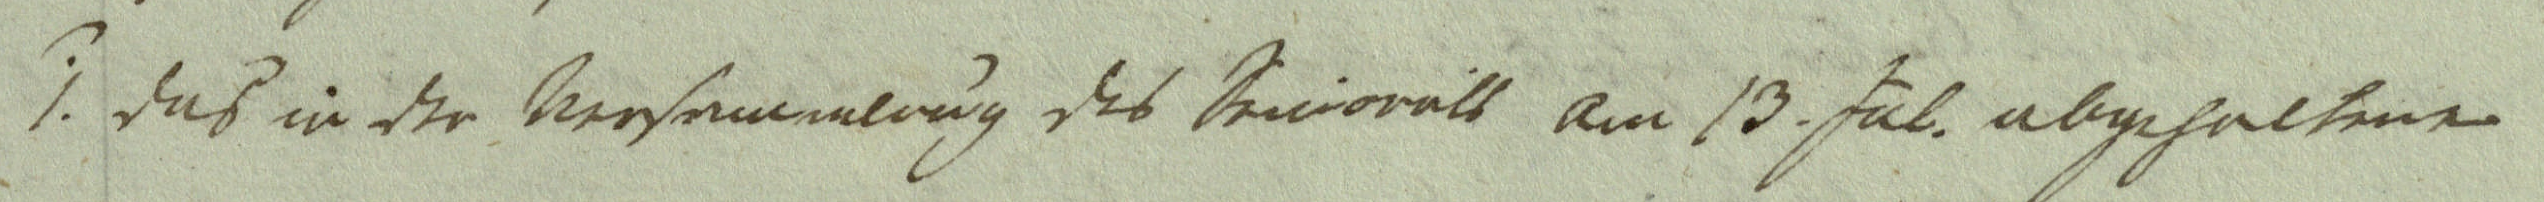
1. das in der Versammlung des Seniorats am 13. Jul. abgehaltene
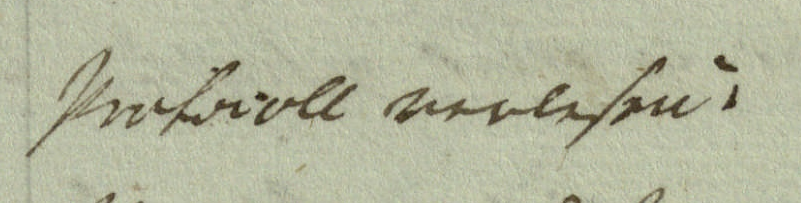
Protocoll verlesen.
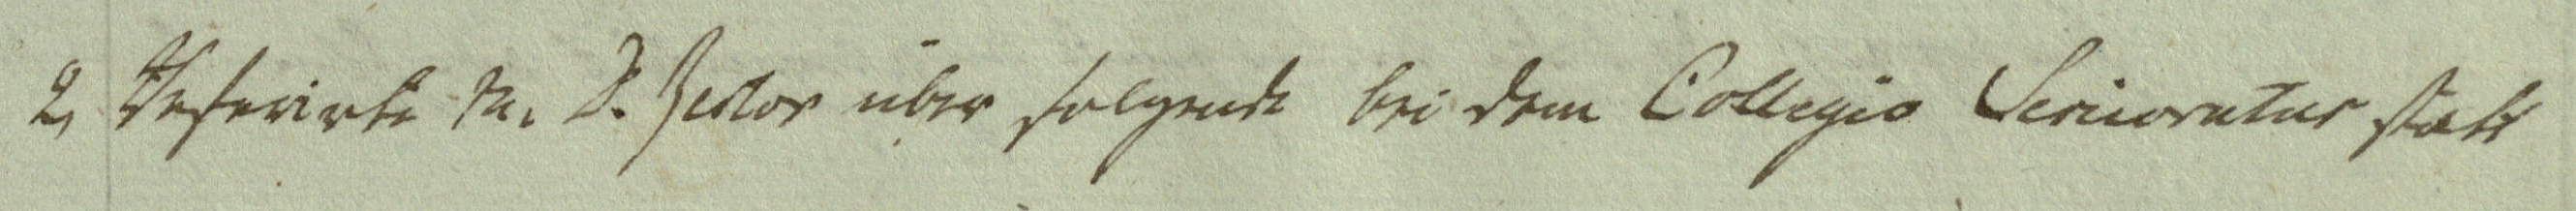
2, Referirte M. D. Rector über folgende bei dem Collegio Senioratus statt
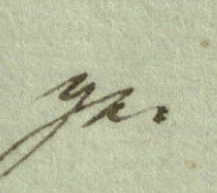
ge.
